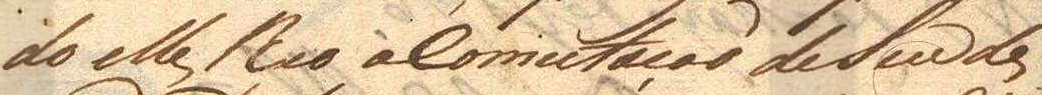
do elle Reo à Comutaçaõ de Seu de
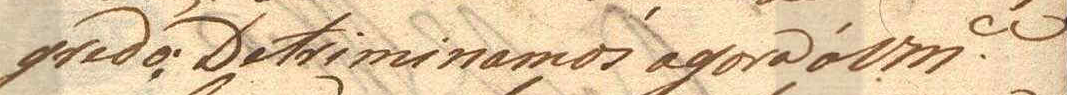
gredo; Detriminamos agora a V M.ce
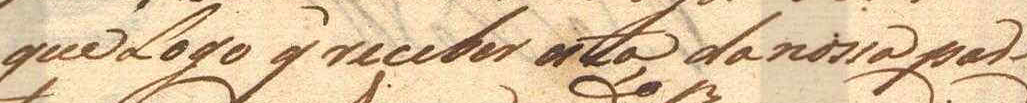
que Logo q̄ receber esta da nossa par
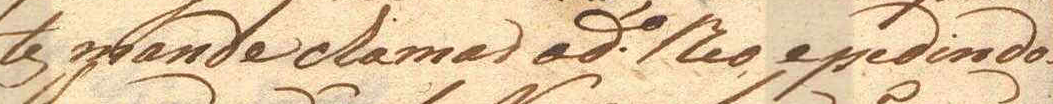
te mande chamar o d.o Reo, e pedindo
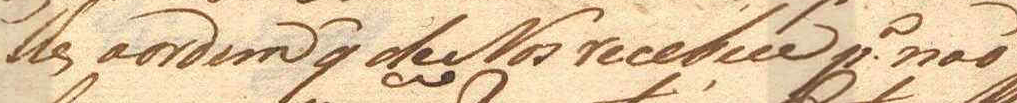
lhe a ordem q̄ de Nos recebece p.a naõ
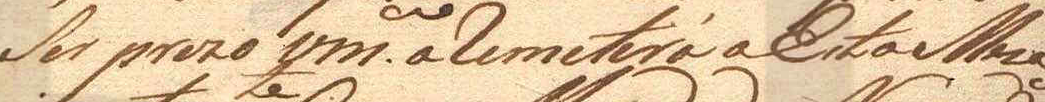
ser prezo V M.ce a Remeterá a Esta Meza
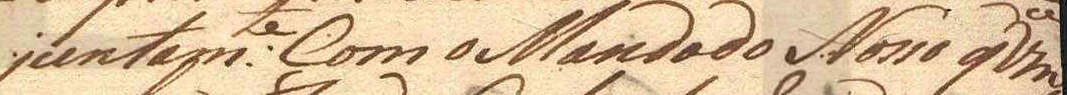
juntam.te Com o Mandado Nosso q̄ V M.ce
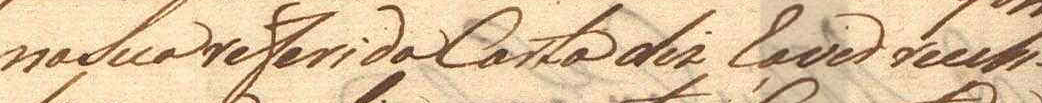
na Sua referida Carta diz haver recebi
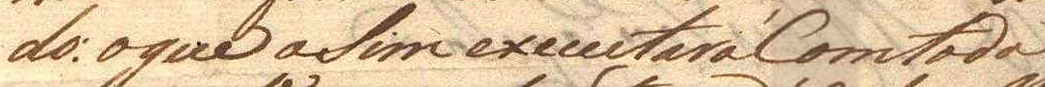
do: o que aSim executara Com toda
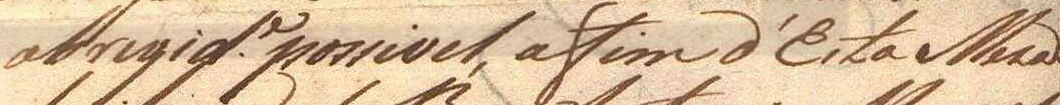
a brevid.e possivel, afim d'Esta Meza
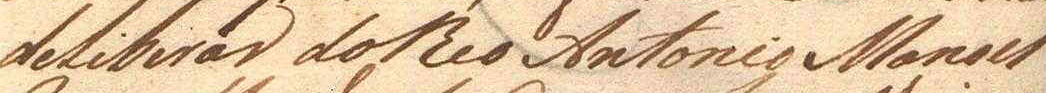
deLiberar do Reo Antonio Manoel
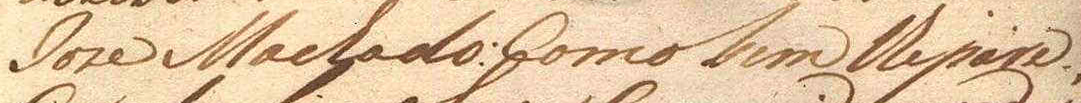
Ioze Machado: Como bem lhe pare
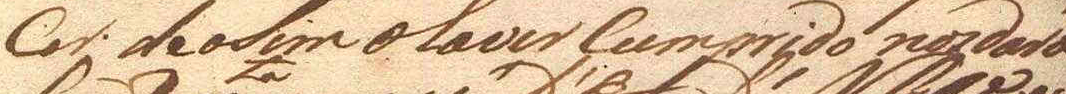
Cer de asim o haver Cumprido nos dara
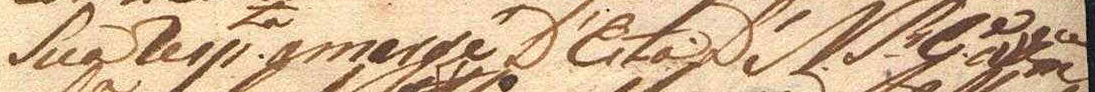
sua Resp.ta a marge D'Esta D̄ N S.r G.e a V M.ce
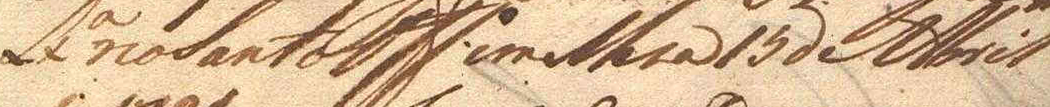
Lx.a no Santo Off.o em Meza 15 de Abril
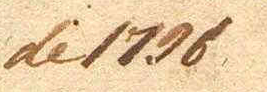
de 1796.
